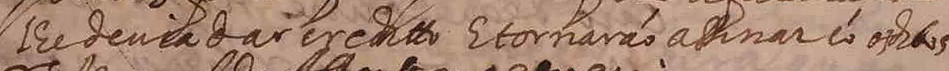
lhe deuia dar creditto e tornaraõ assinar cō os ditos
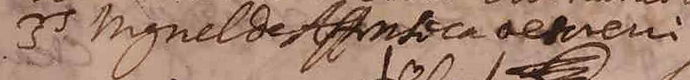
srs miguel de Affonseca o escreui
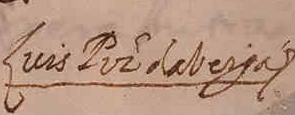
Luis Piz̄ da veiga
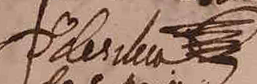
Po de silua
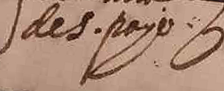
de s. payo
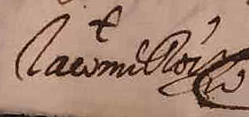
Iacome Roīz
